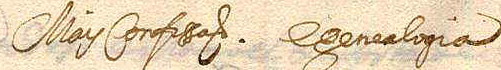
Mais Confissão. e genealogia
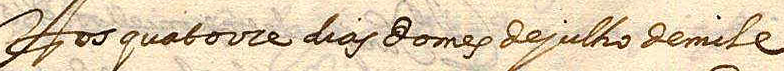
Aos quatorze dias do mes de julho de miL e
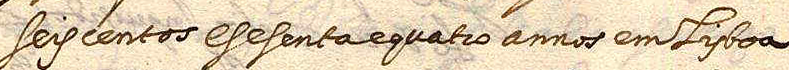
seiscentos e sesenta e quatro annos em Lisboa
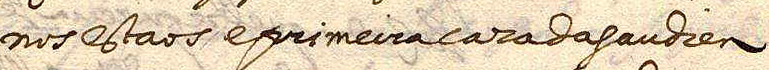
nos estaos e primeira caza das audien
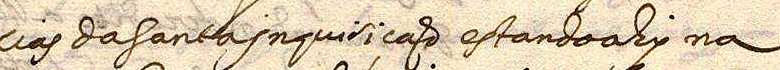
cias da santa jnquisiçaõ estando ahy na
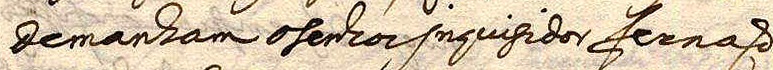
de manham o senhor jnquisidor fernaõ
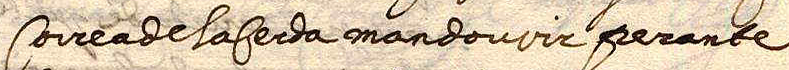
Correa de LaCerda mandou uir perante
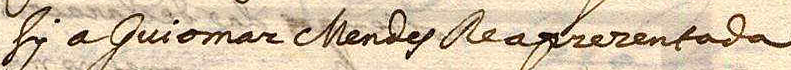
sy a Guiomar Mendes Re aprezentada
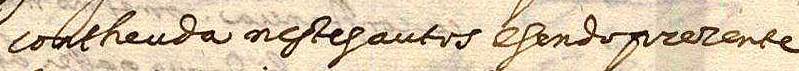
contheuda nestes autos e sendo prezente
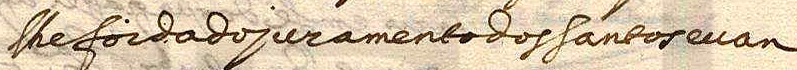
lhe foi dado juramento dos santos euan
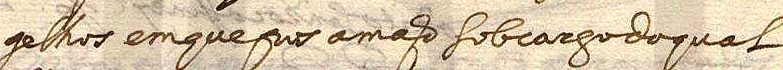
gelhos em que pos a maõ sob cargo do quaL
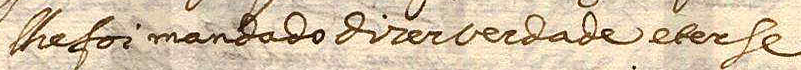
lhe foi mandado dizer verdade e ter se
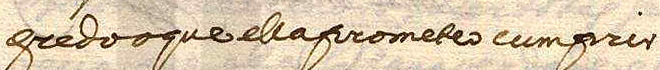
gredo o que ella prometeo cumprir.
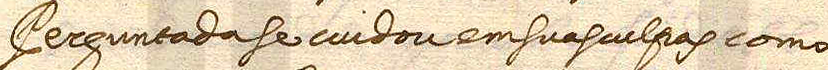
Perguntada se cuidou em suas culpas como
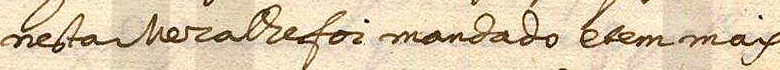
nesta Meza lhe foi mandado e tem mais
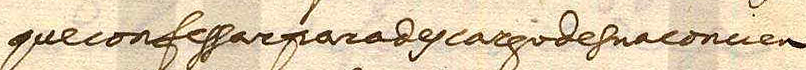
que confessar para descargo de sua concien
